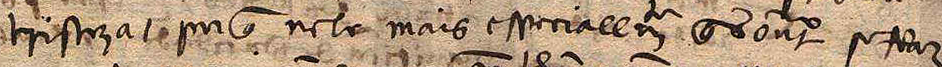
tristeza / porq̄ nele mais especiallmte q̄ ē outro se ffaz
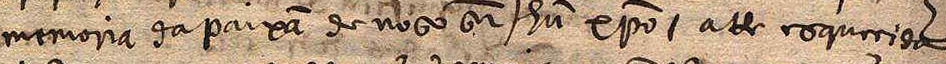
memoria da paixā de noso s̄or Jhū xp̄o / a Re esquecida
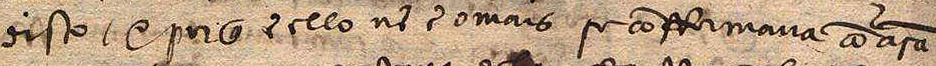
disto / e porq̄ ē elle nē ē o mais se c̄offormaua c̄o a s̄a
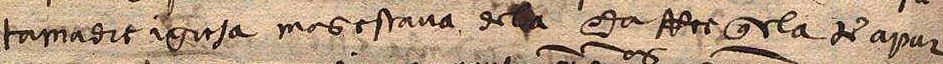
ta madre igreja mas estaua dela e da ffee q̄ ela tē apar
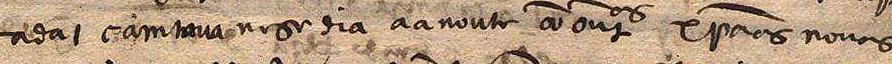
tada / camtaua nese dia aa noute c̄o outras xpāas nouas
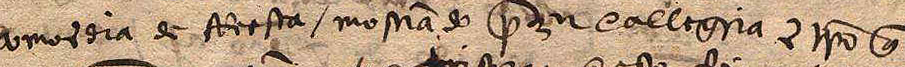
como ē dias de ffeesta / mostrādo p̄zer e allegria ē tp̄o q̄
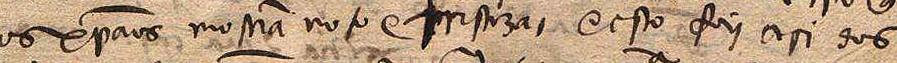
os xpãos mostrā nojo e tristeza / e esto foy asi dos
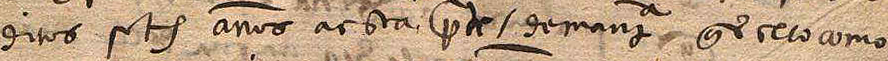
ditos setꝭ ānos a esta p̄te / de manra q̄ ē ello como
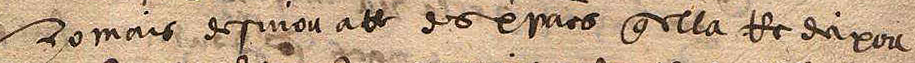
ē o mais desuiou a Re dos xpãos q̄ ella Re deixou
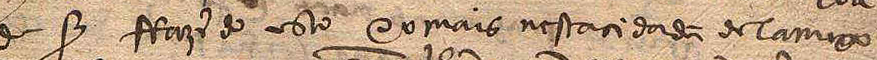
de ꞩ ffazēdo esto e o mais nesta cidade de lamego
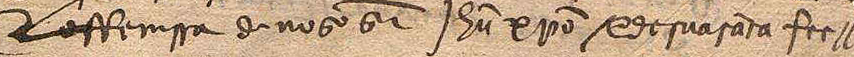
ē offemssa de noso s̄or Jhū xpō / e de sua sāta fee //
